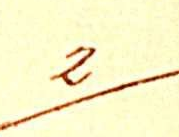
2
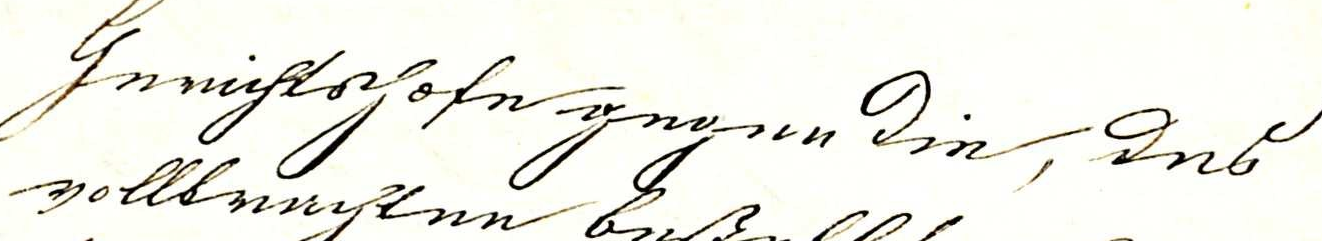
Gerichtshofe gegen die, des
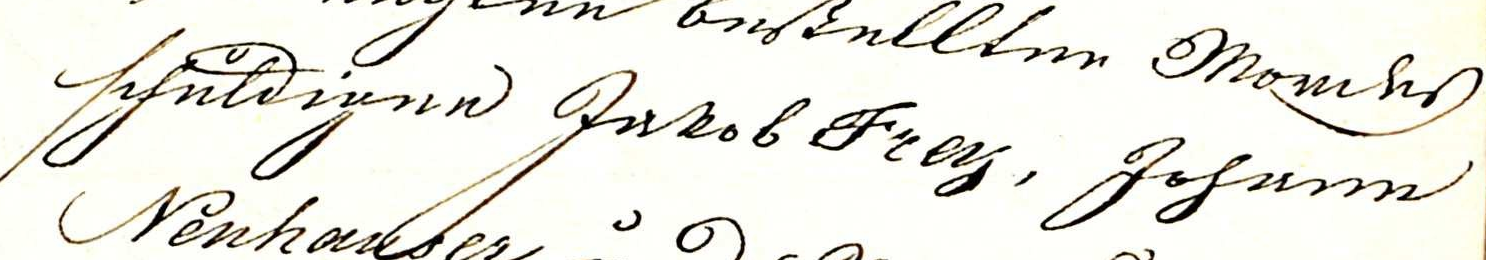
vollbrachten bestellten Mordes
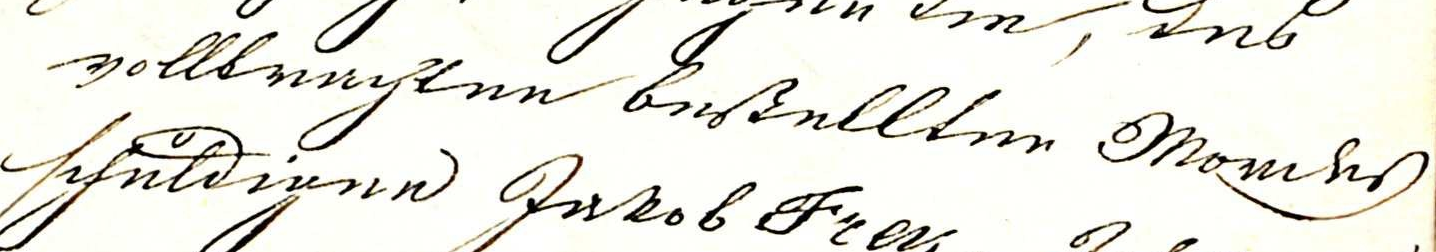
schuldigen Jakob Frey, Johann
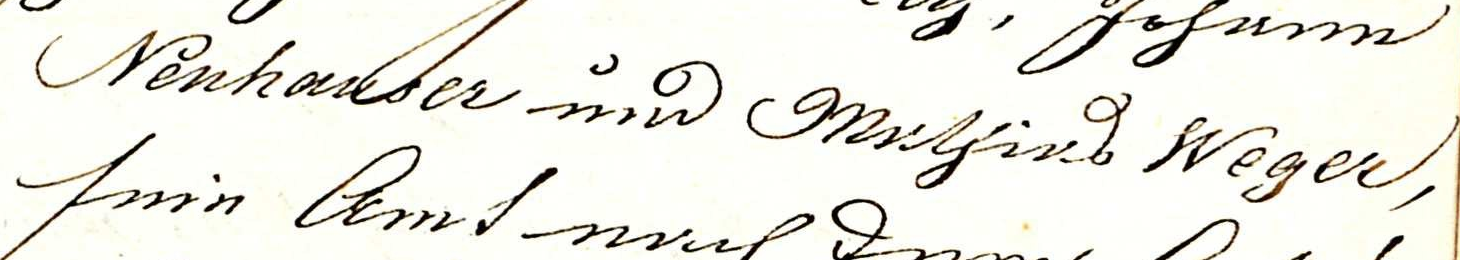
Neuhauser und Mathias Weger,
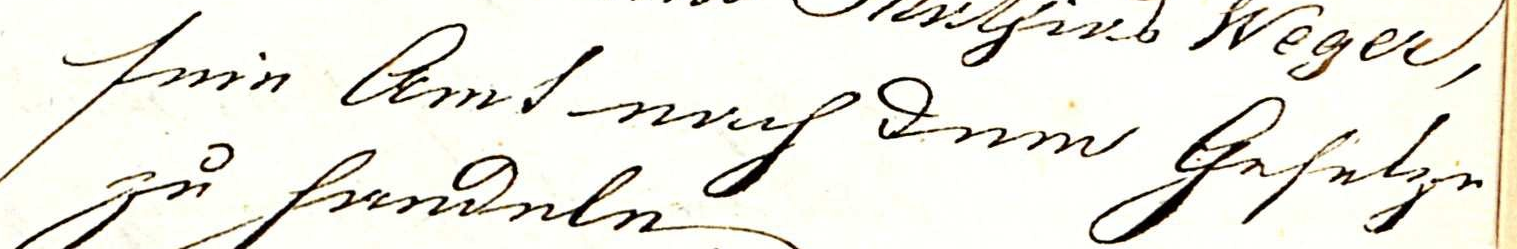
sein Amt nach dem Gesetze
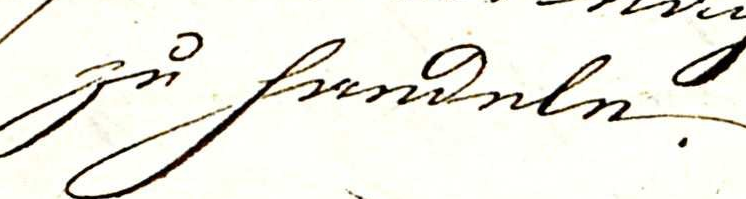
zu handeln.
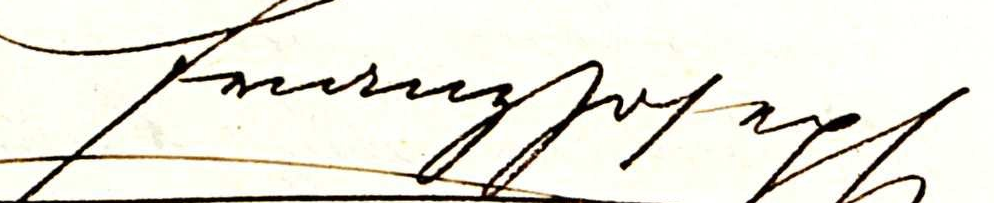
Franz Joseph
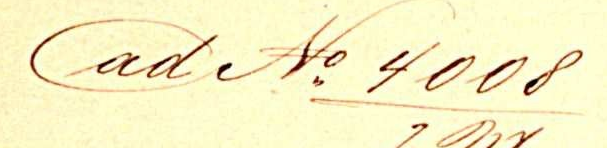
ad No 4008/
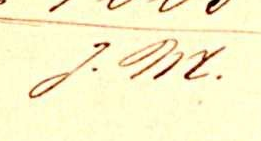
J.M.
